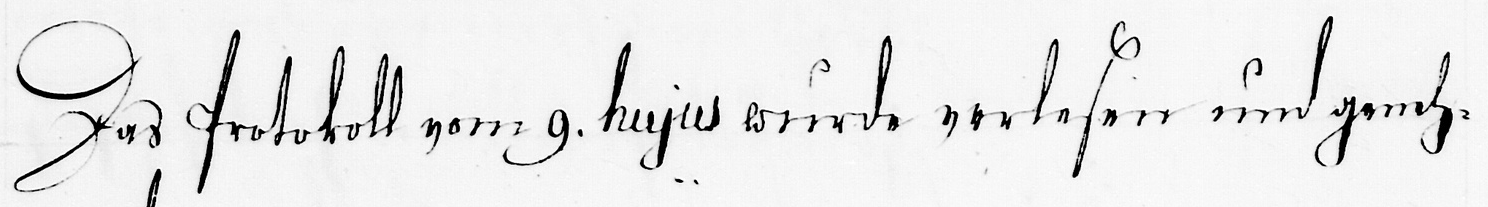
Das Protokoll vom 9. hujus wurde verlesen und geneh¬
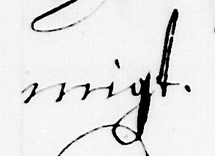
migt.
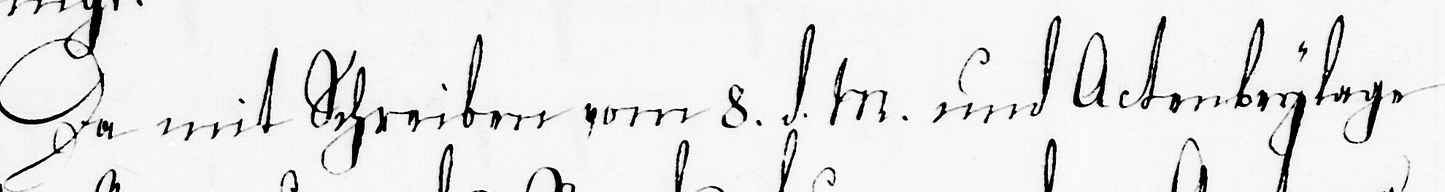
Da mit Schreiben vom 8. d. M. und Actenbeylage
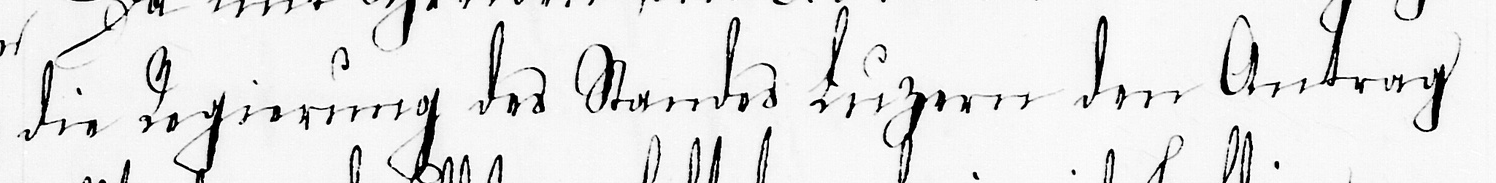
die Regierung des Standes Luzern den Antrag
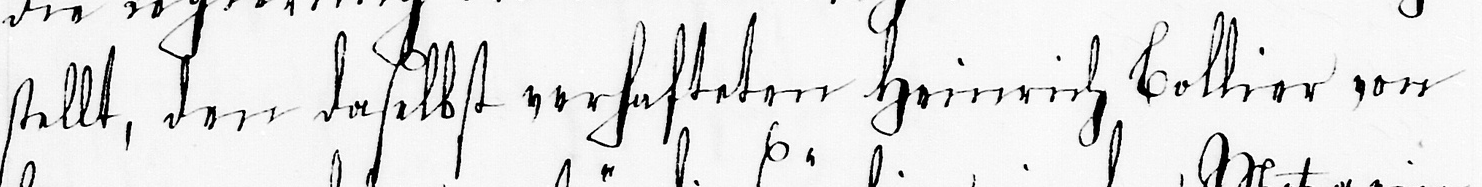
ellt, den daselbst verhafteten Heinrich Bollier von
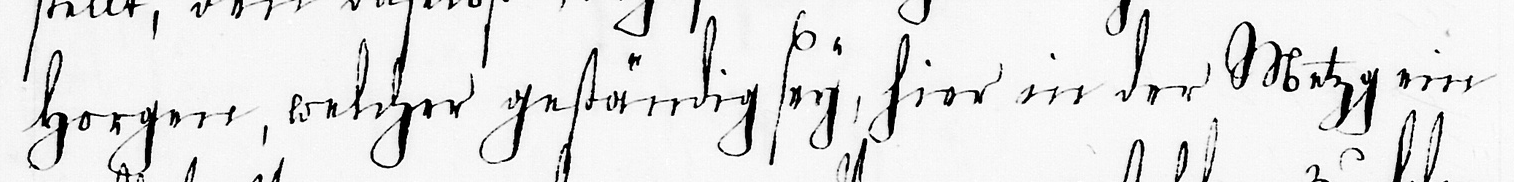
Horgen, welcher geständig sey, hier in der Metzg ein
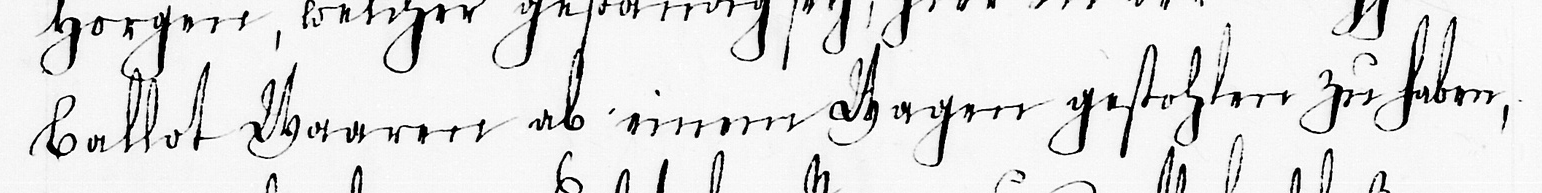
Ballot Waaren ab einem Wagen gestohlen zu haben,
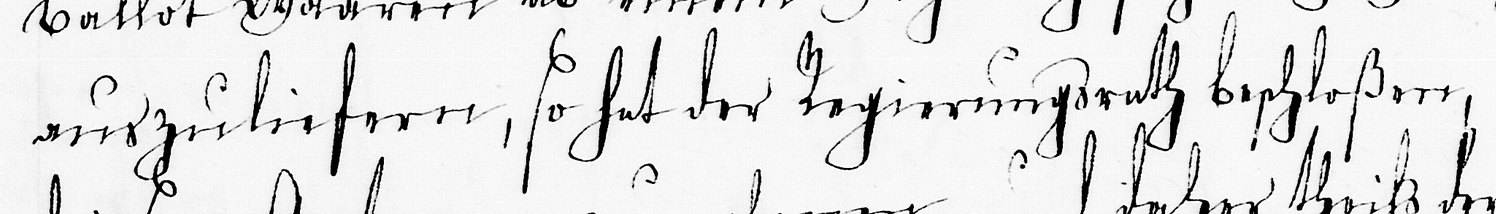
auszuliefern, so hat der Regierungsrath beschloßen,
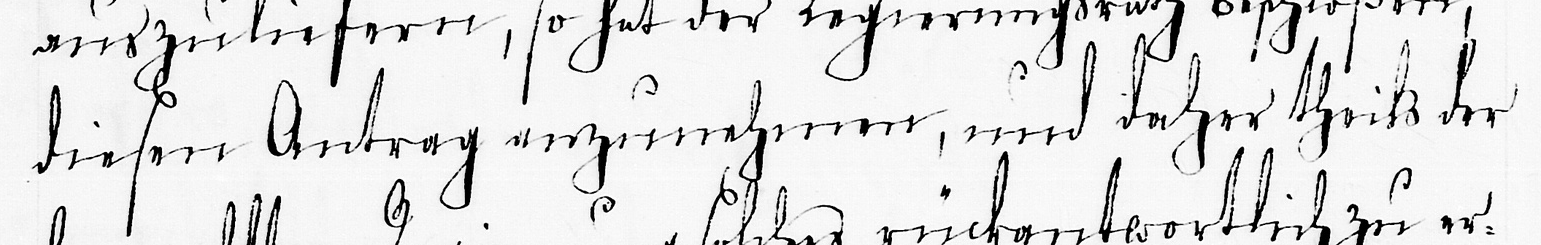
diesen Antrag anzunehmen, und daher theils der
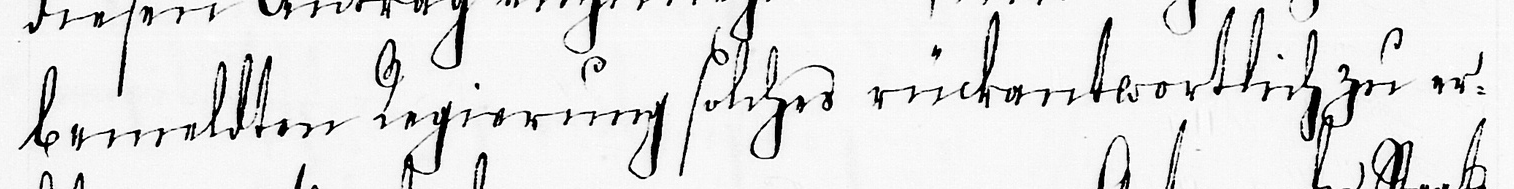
bemeldten Regierung solches rückantwortlich zu er¬
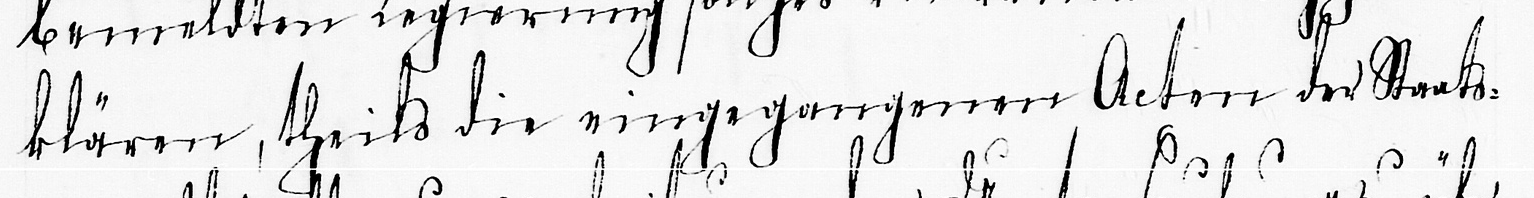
klären, theils die eingegangenen Acten der Staats¬
